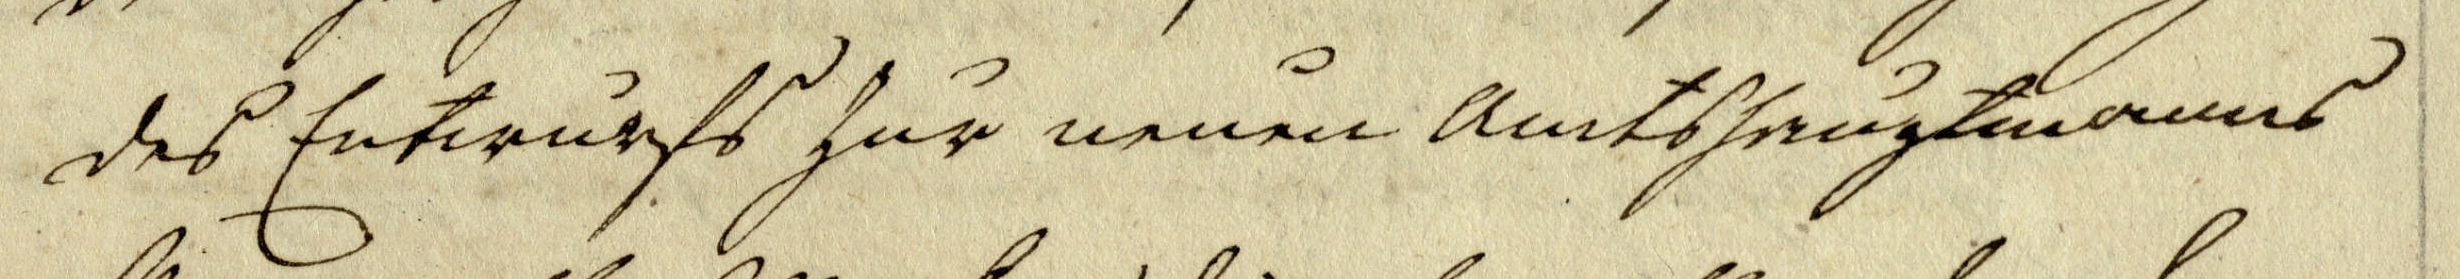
des Entwurfs zur neuen Amtshauptmanns
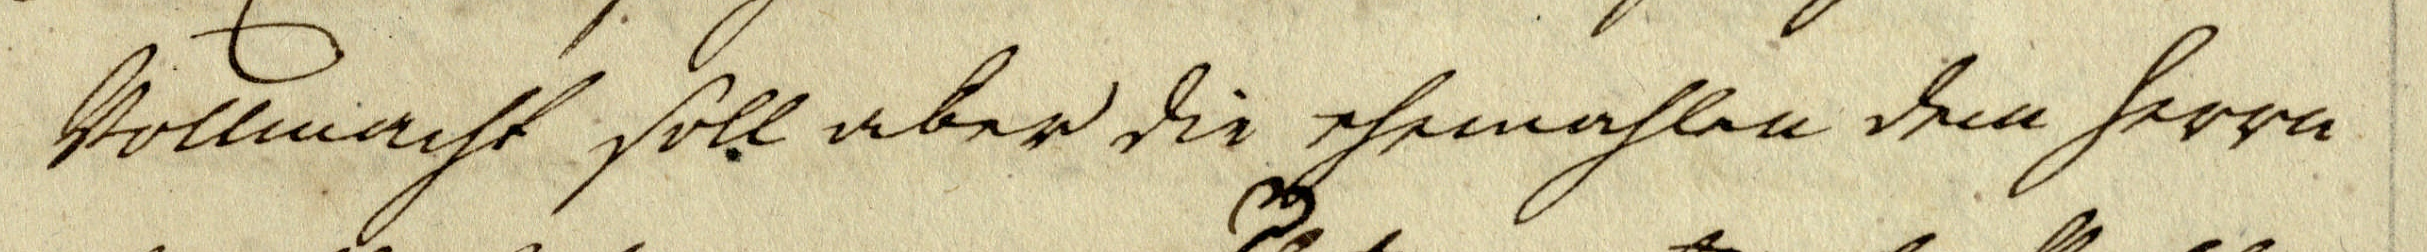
Vollmacht soll aber die ehemahlen dem Herrn
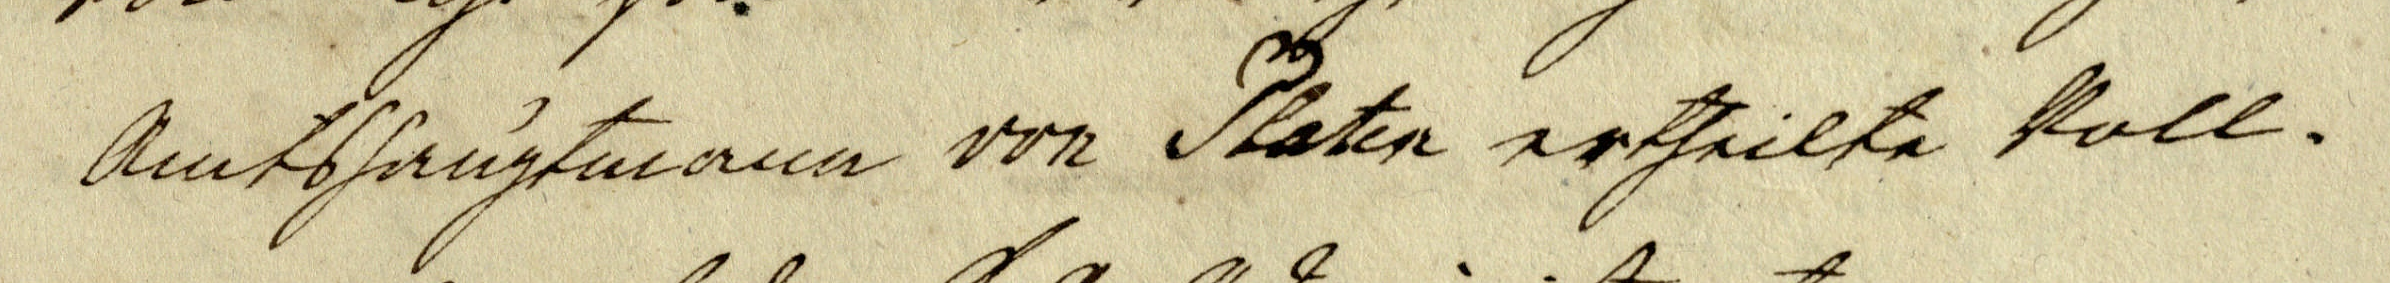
Amtshauptmann von Platen ertheilte Voll¬
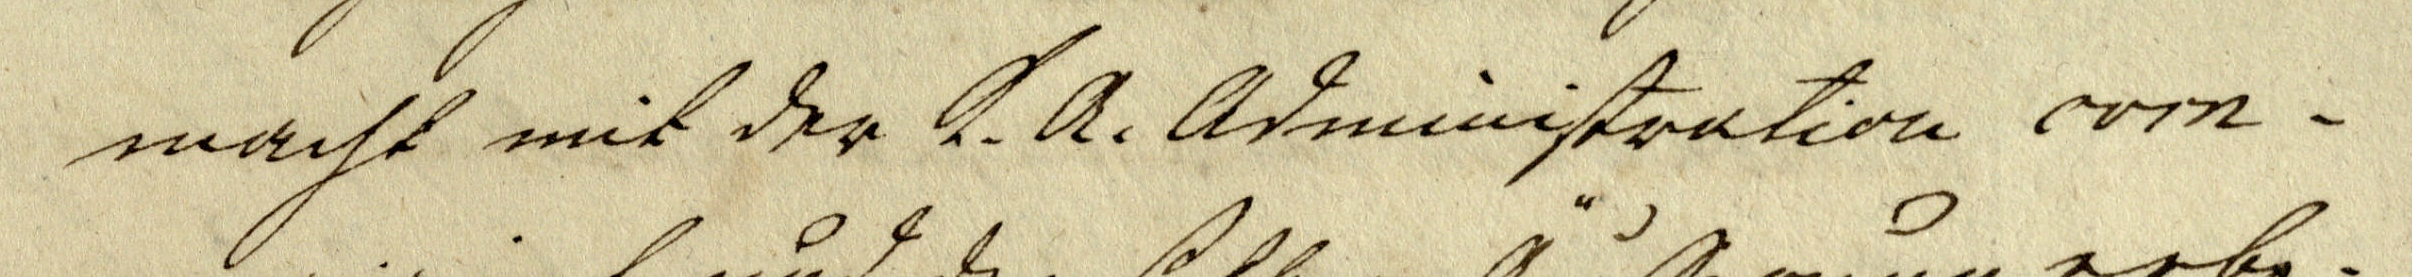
macht mit der K. A. Administration com¬
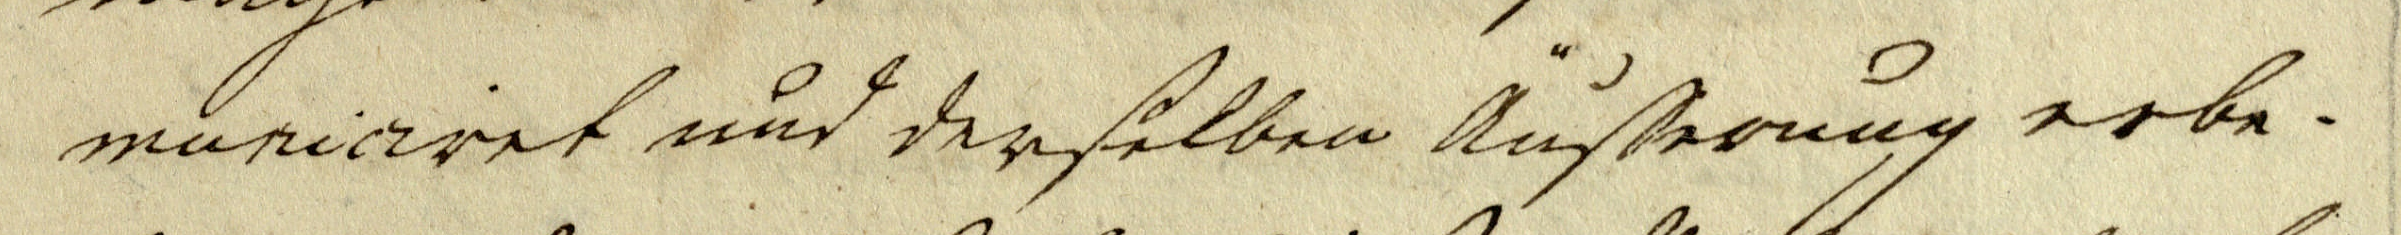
municiret und derselben Äusserung erbe¬
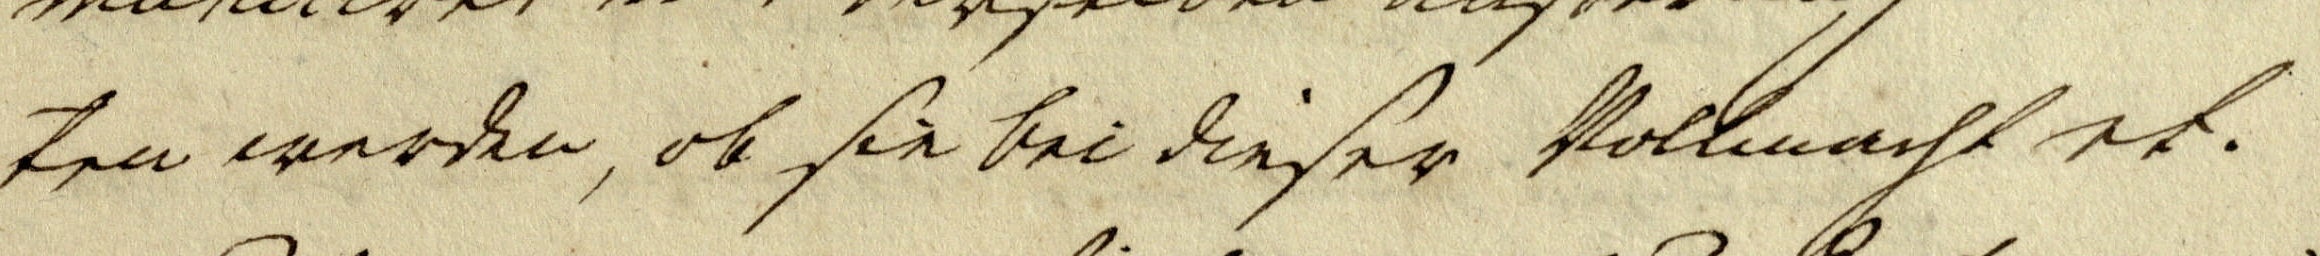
ten werden, ob sie bei dieser Vollmacht et¬
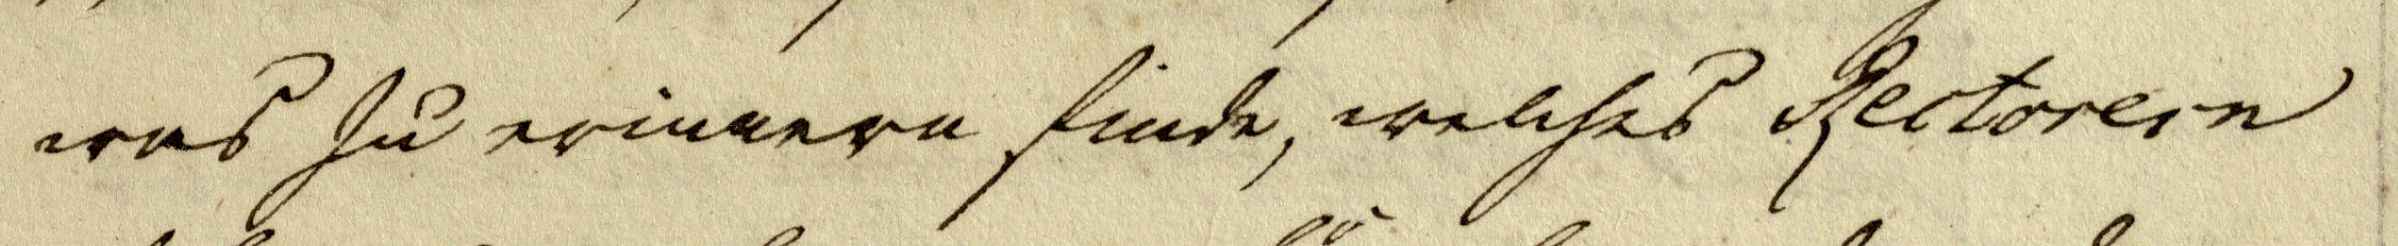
was zu erinnern finde, welches Rectorem
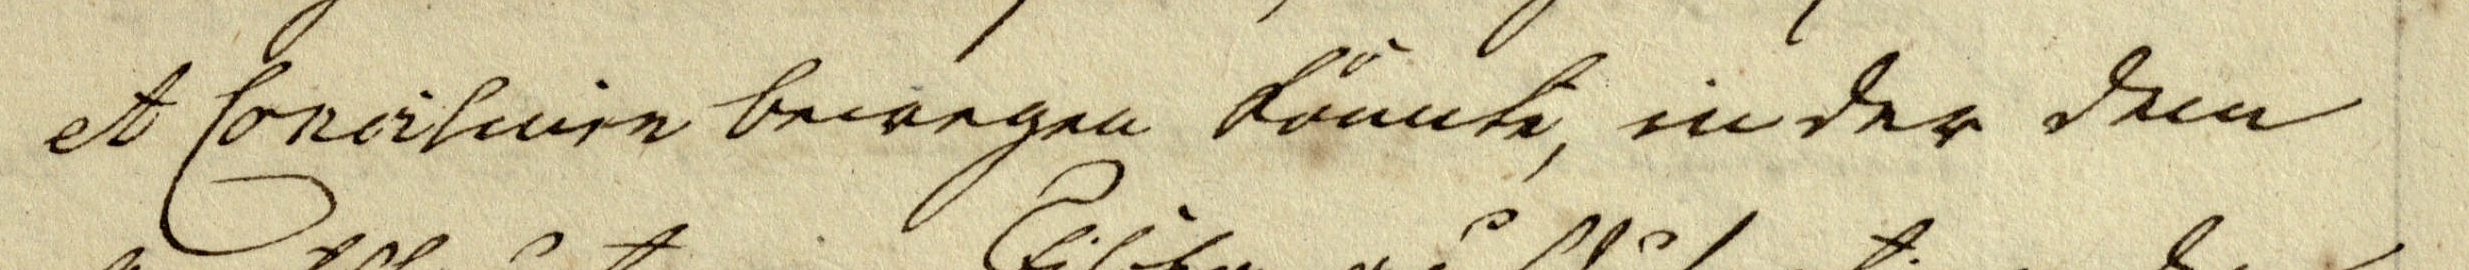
et Concilium bewegen könnte, in der dem
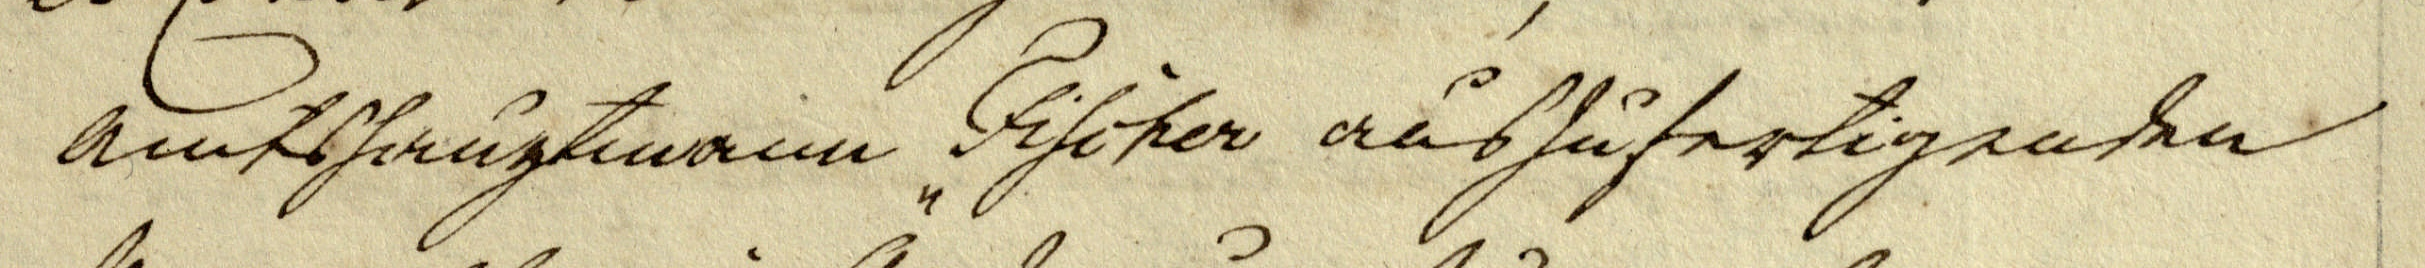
Amtshauptmann Fischer auszufertigenden
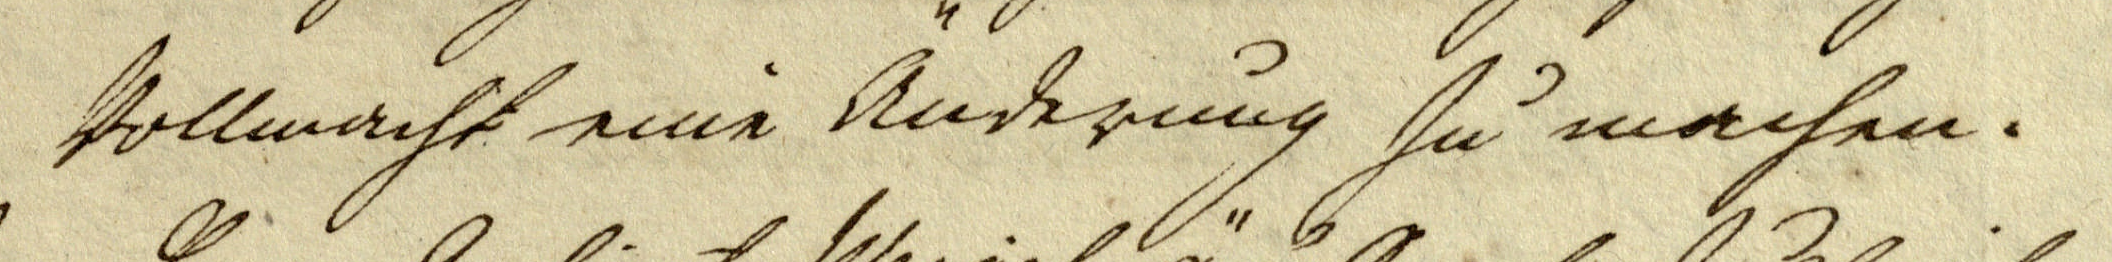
Vollmacht eine Änderung zu machen.
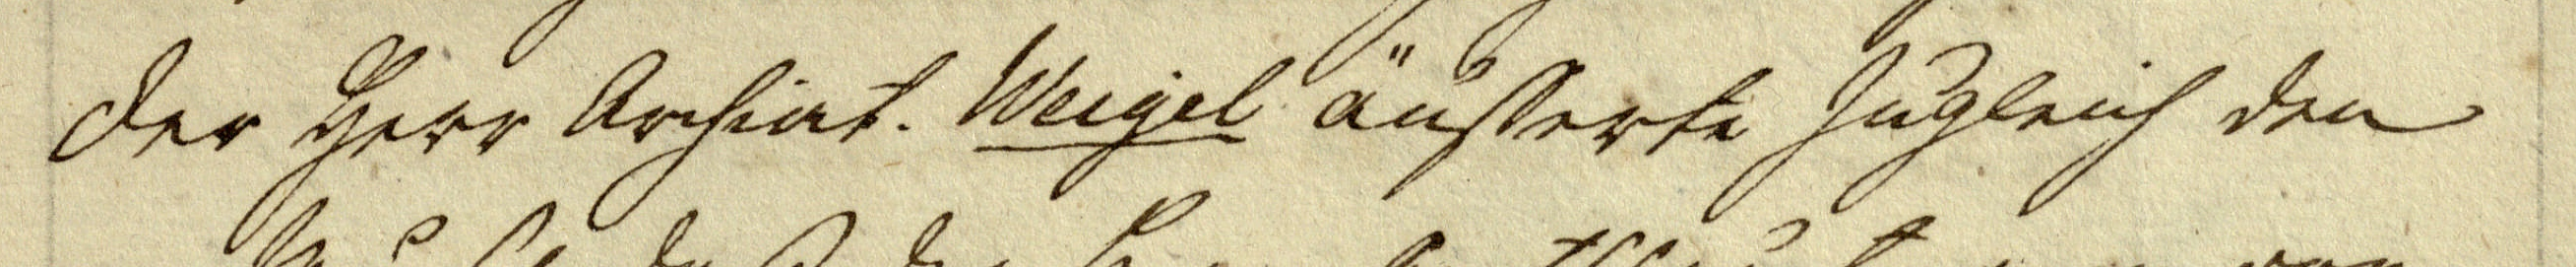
Der Herr Archiat. Weigel äusserte zugleich den
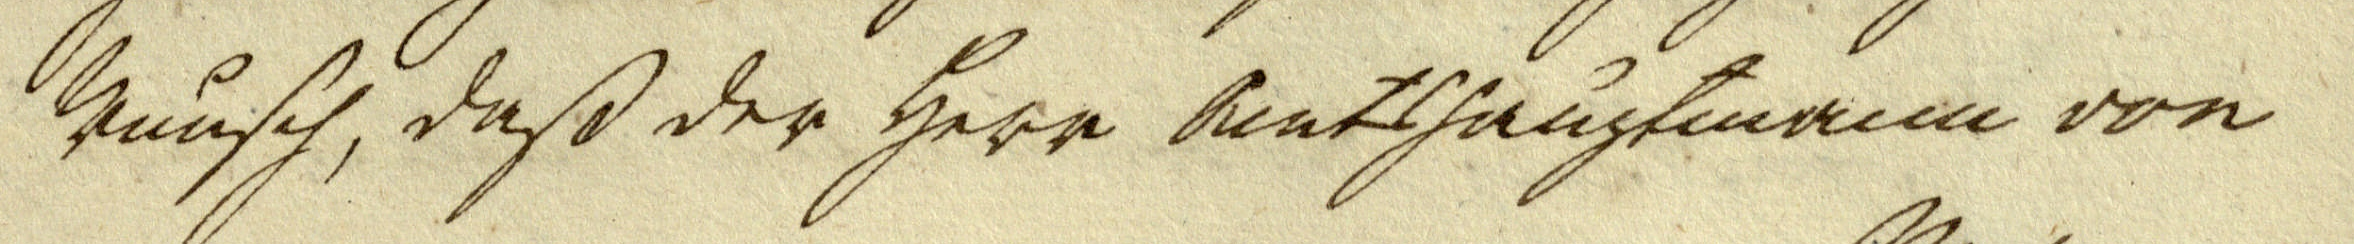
Wunsch, daß der Herr Amtshauptmann von
